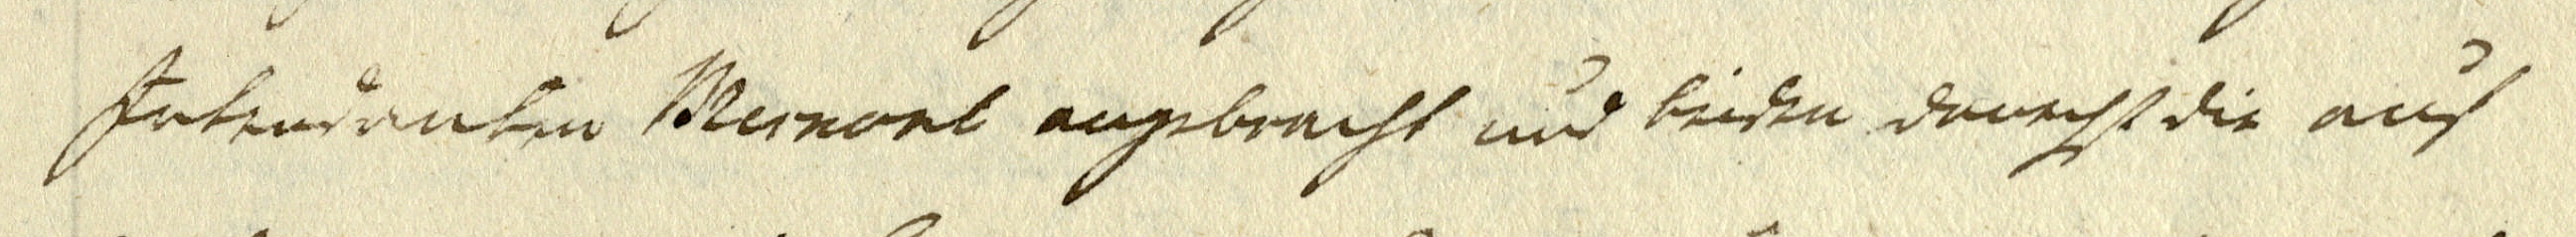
Intendanten Bremont angebracht und beiden danechst die auf
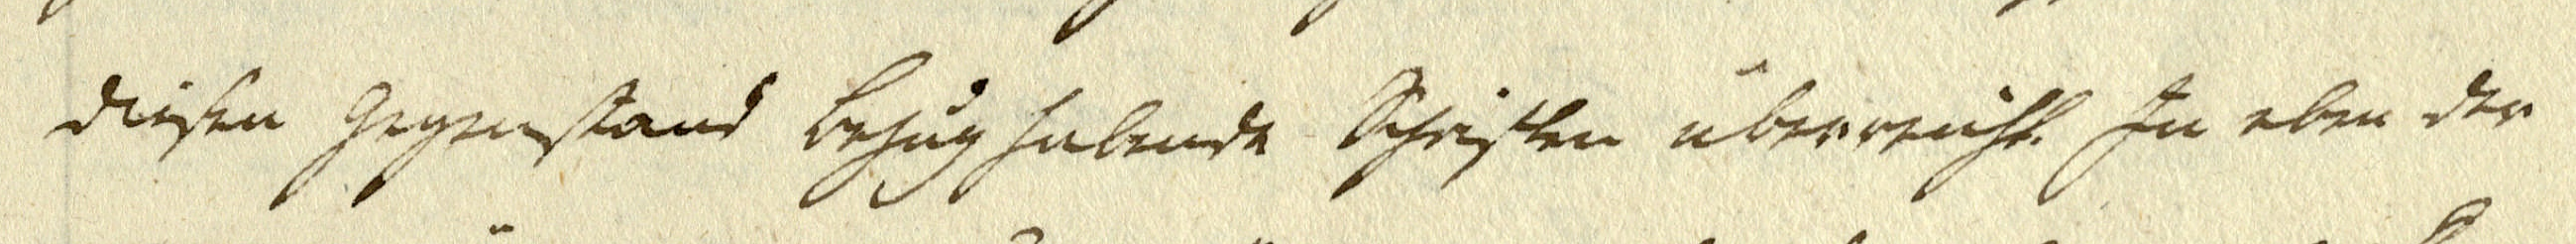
diesen Gegenstand Bezug habende Schriften überreicht. In eben der
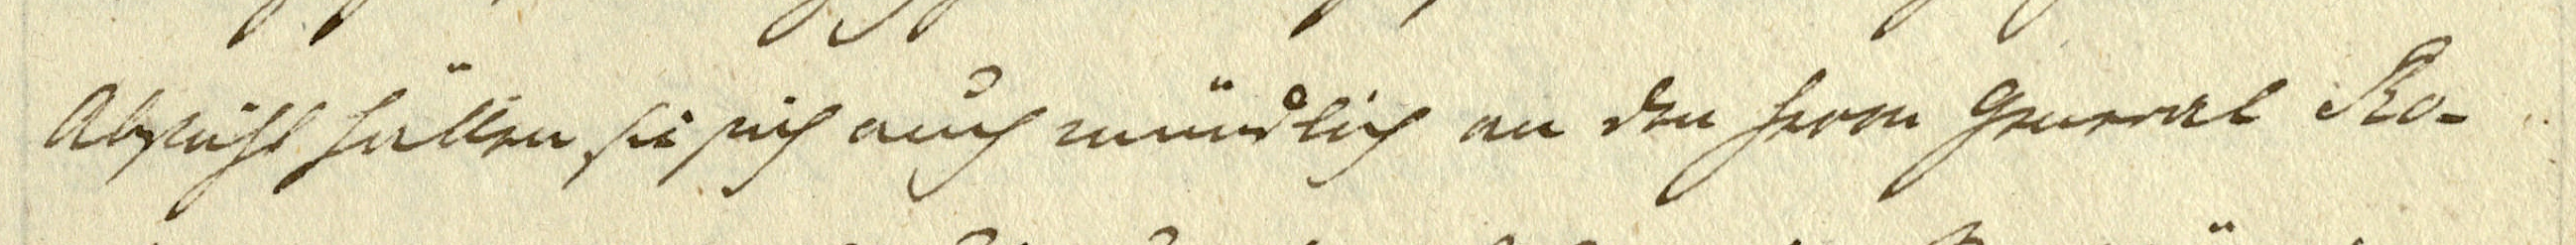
Absicht hätten sie sich auch mündlich an den Herrn General Ro¬
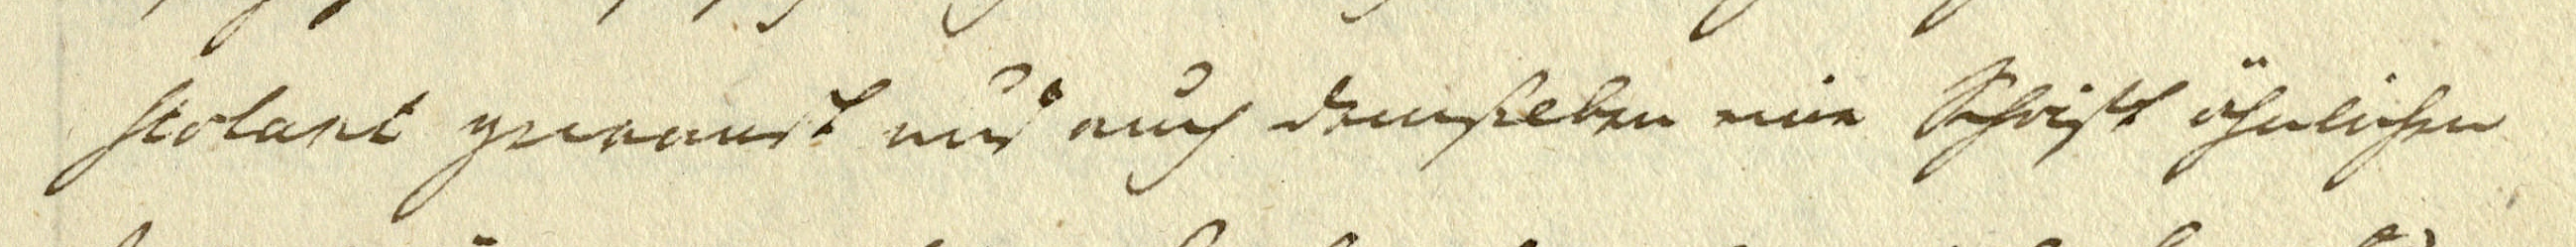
scolant gewandt und auch demselben eine Schrift ähnlichen
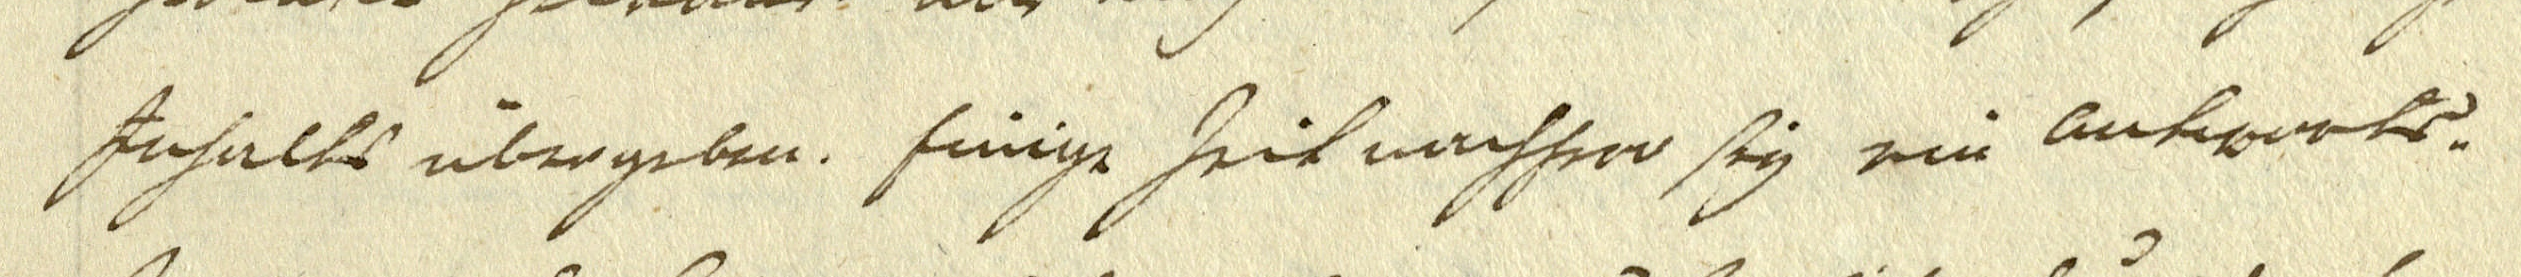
Inhalts übergeben. Einige Zeit nachhero seÿ ein Antworts¬
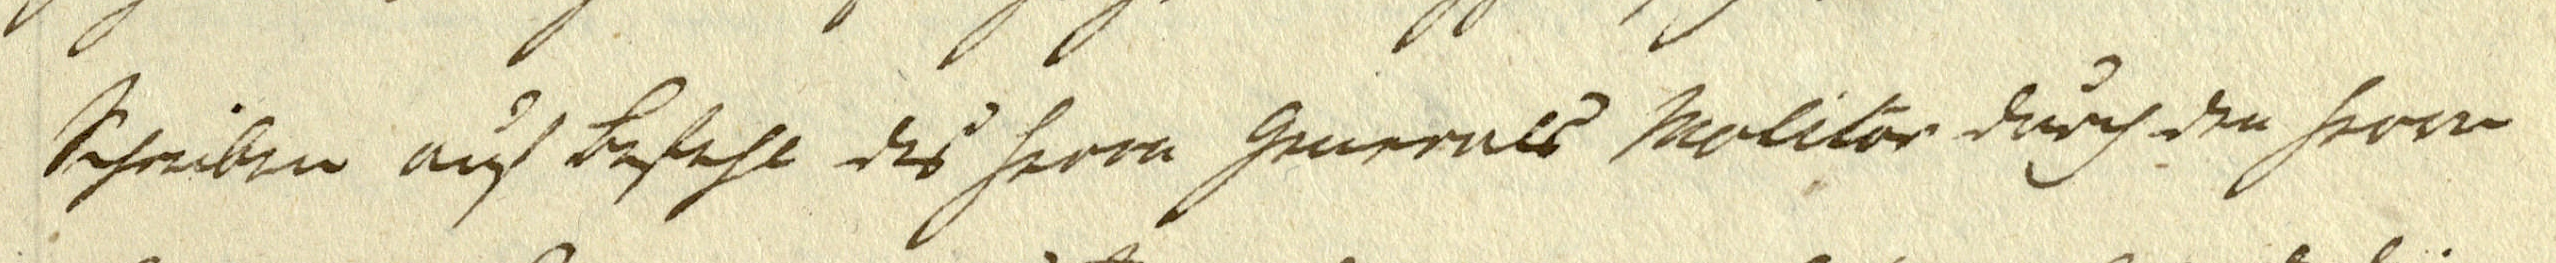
Schreiben auf Befehl des Herrn Generals Molitor durch den Herrn
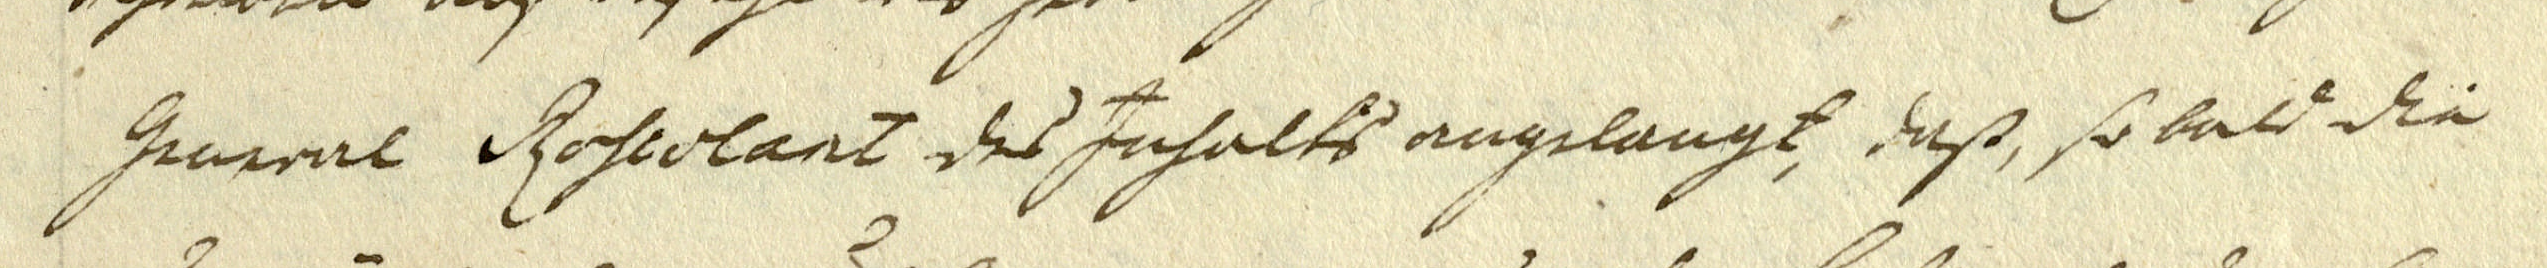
General Roscolant des Inhalts angelangt, daß, so bald die
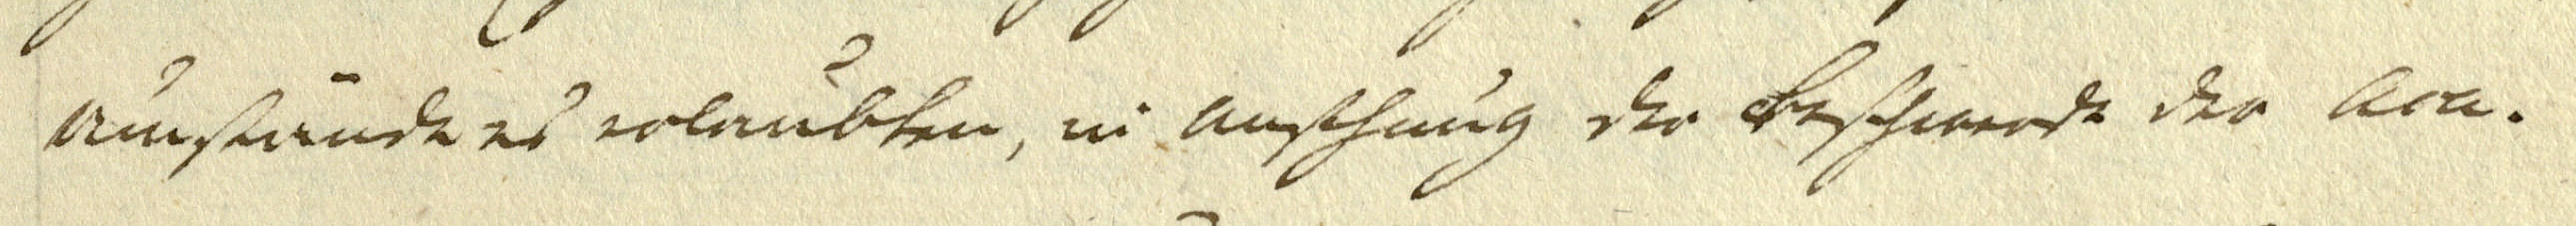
Umstände es erlaubten, in Ansehung der Beschwerde der Aca¬
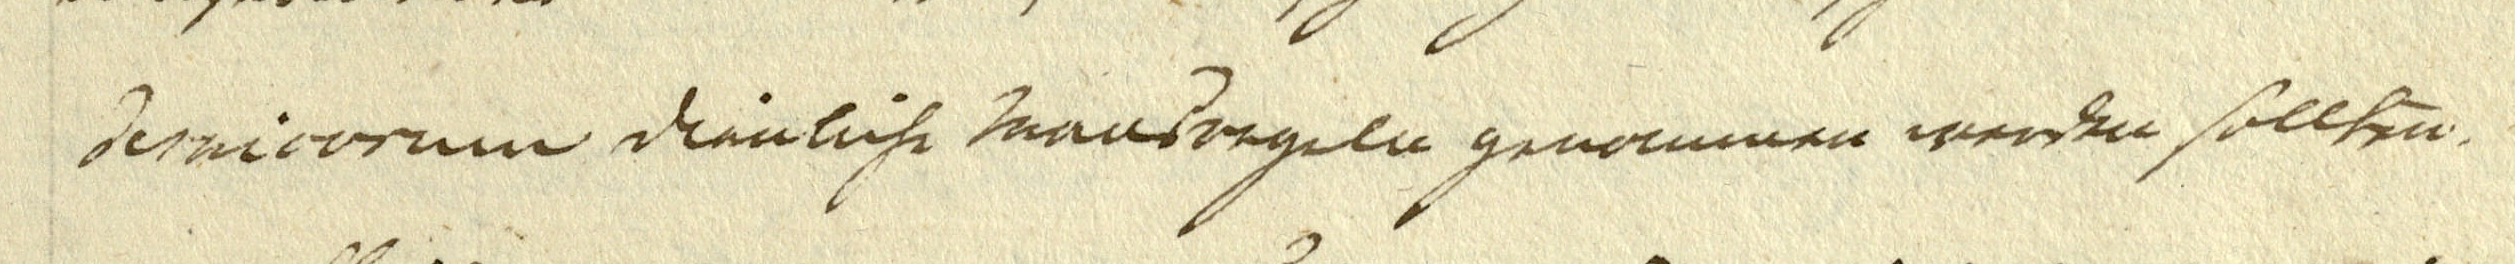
demicorum dienliche Maasregeln genommen werden sollten.
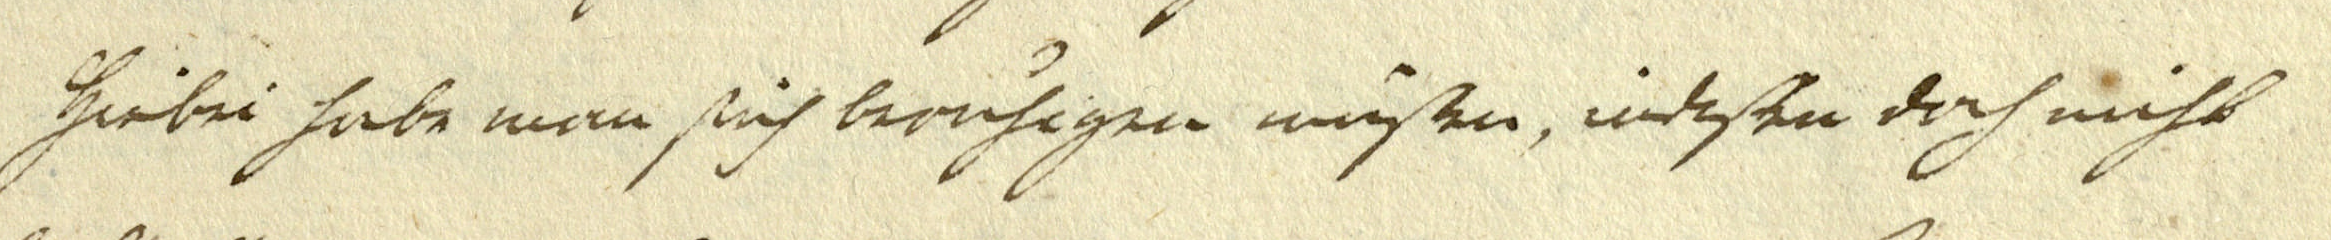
Hiebei habe man sich beruhigen müssen, indessen doch nicht
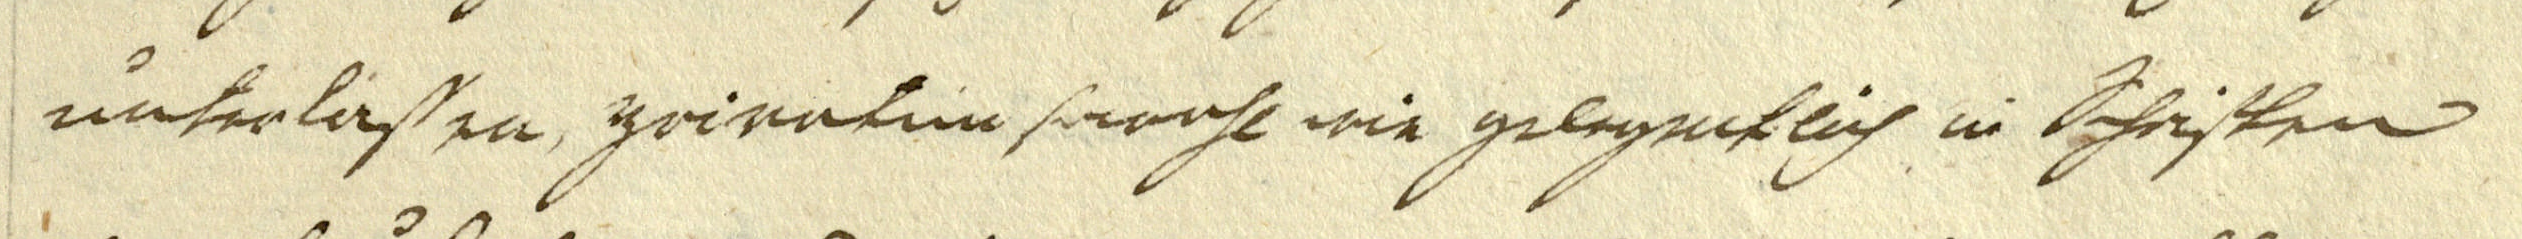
unterlassen, privatim sowohl wie gelegentlich in Schriften
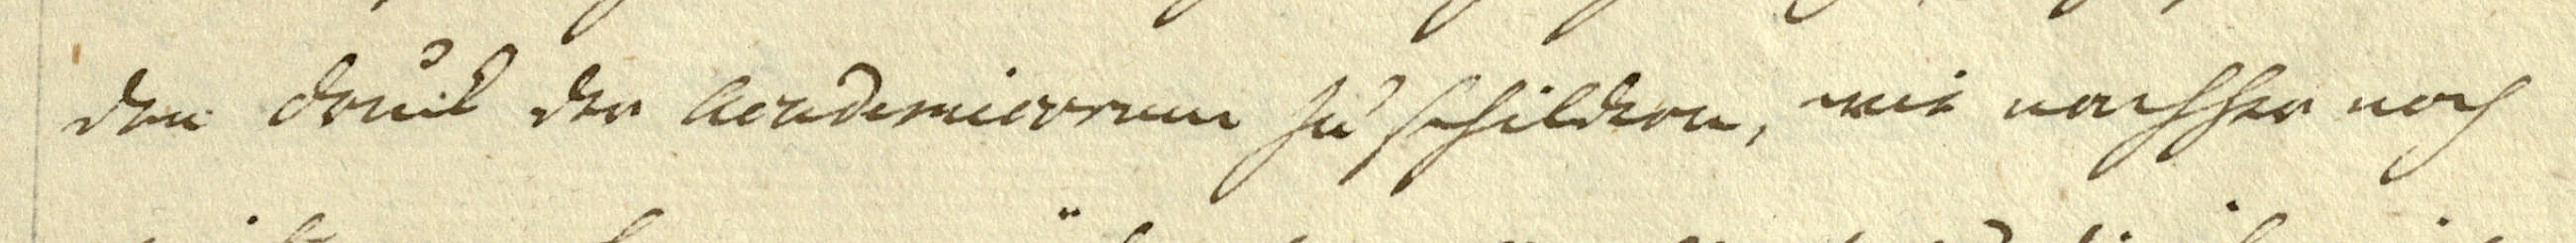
den Druck der Academicorum zu schildern, wie nachher noch
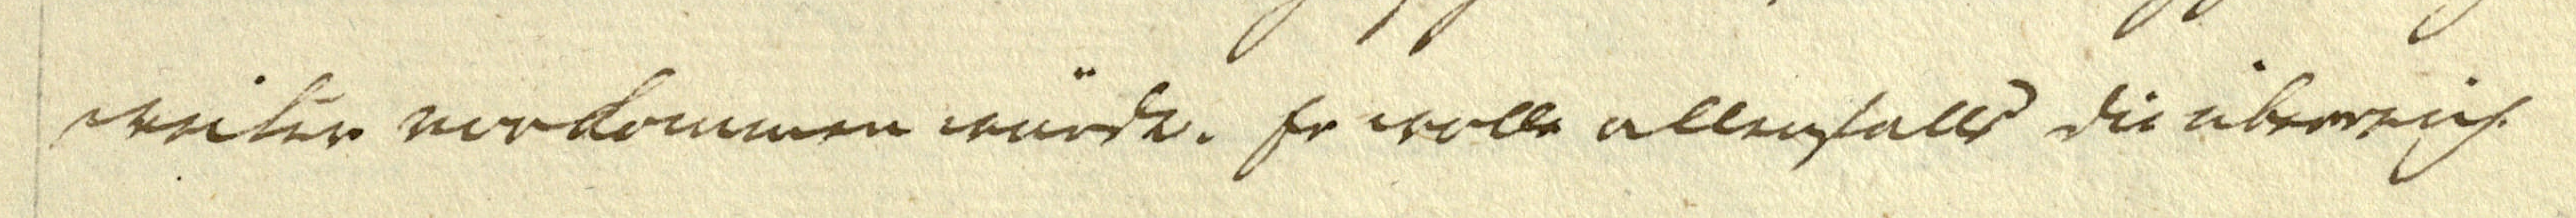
weiter vorkommen würde. Er wolle allenfalls die überreich¬
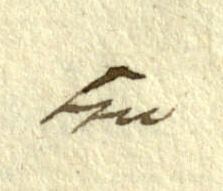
ten
